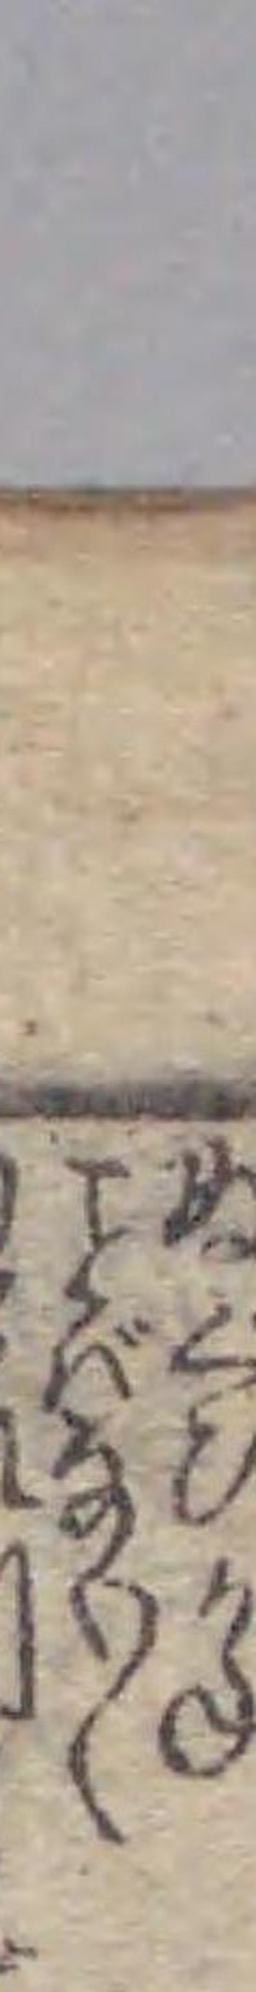ことばなく〳〵
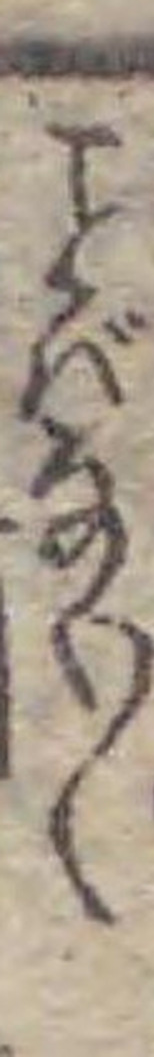ことばなく〳〵
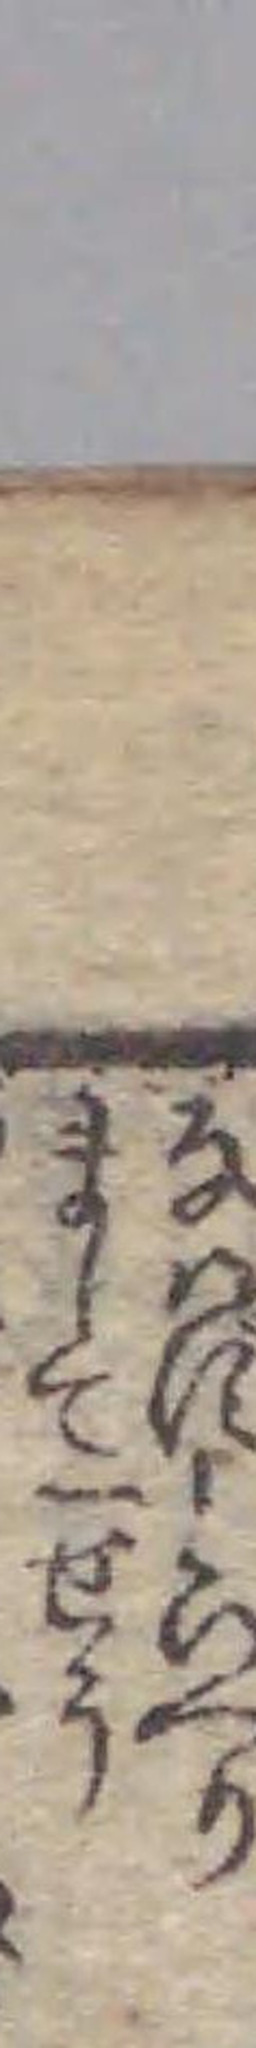まして一せう
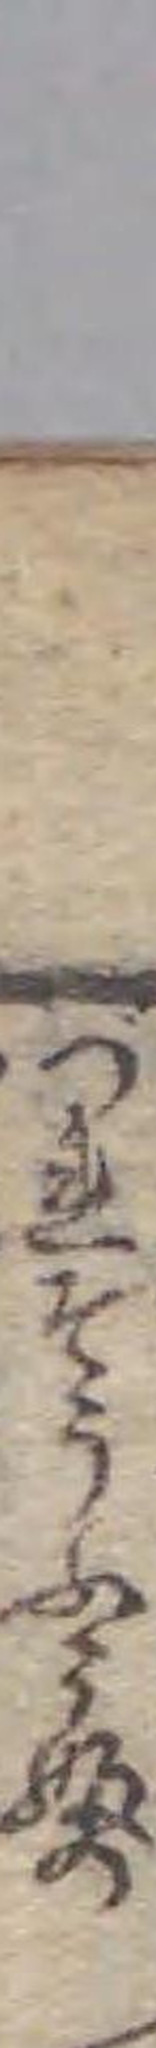つれそうふうふの
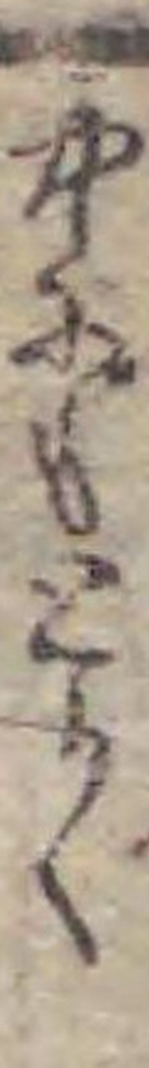中にもとかく
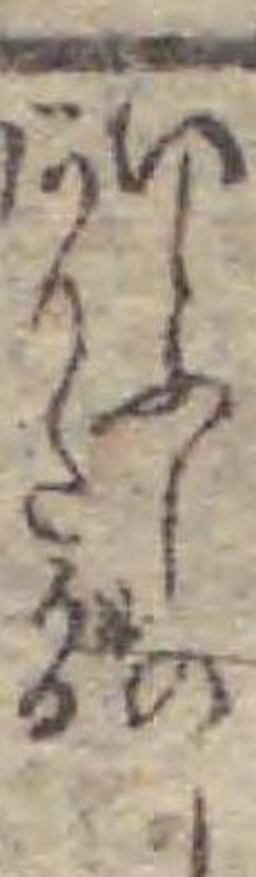ありたかる
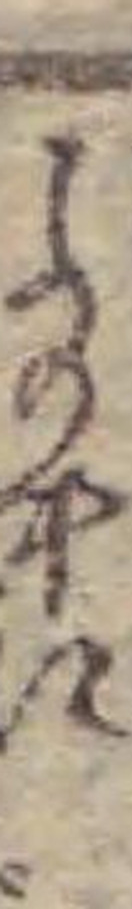よの中に
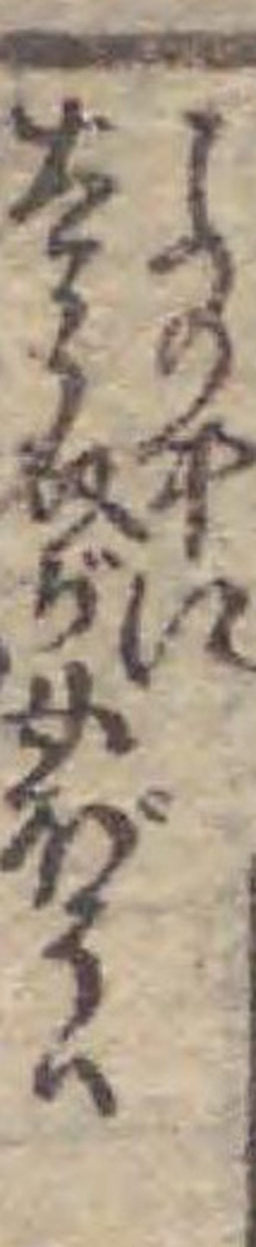太郎介が女ぼうは
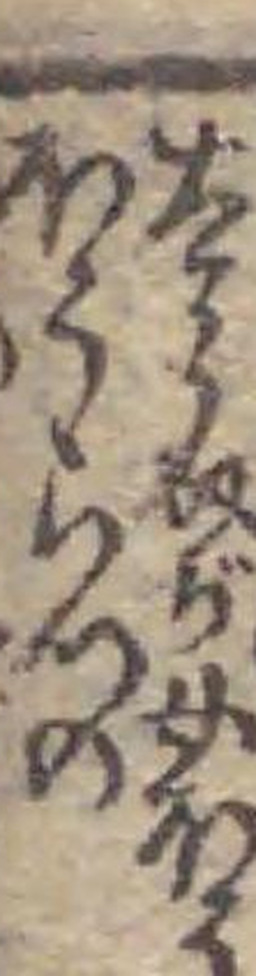ほうらつの
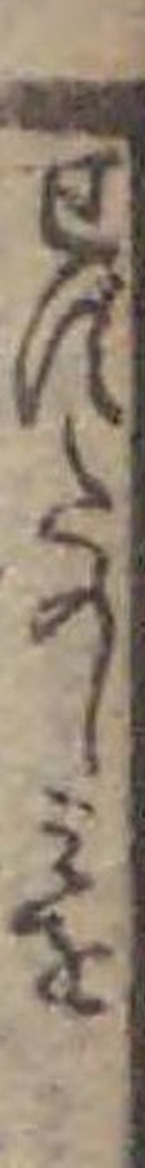せずたのしみを
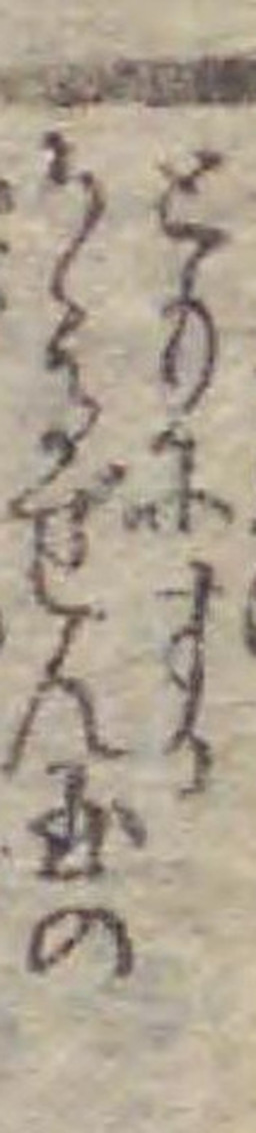かゝるぜん玉の
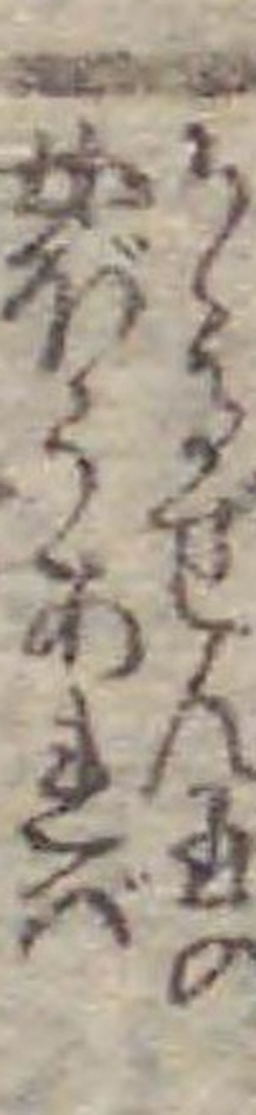女ぼうあれば
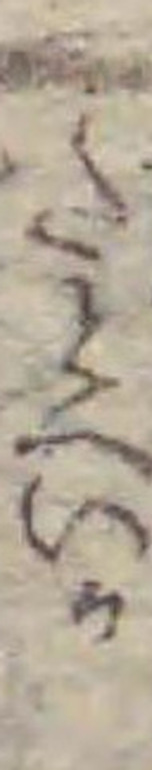たとへいか
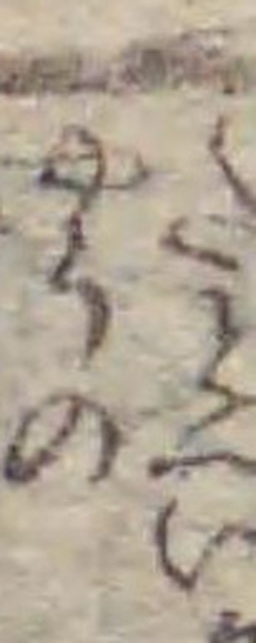やうの
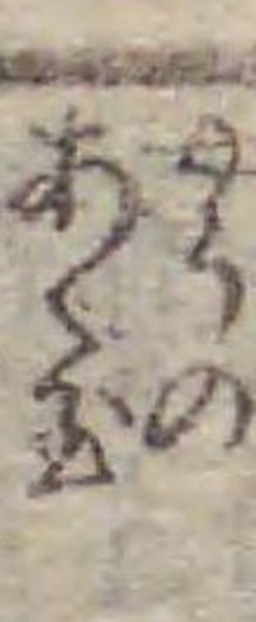あく玉
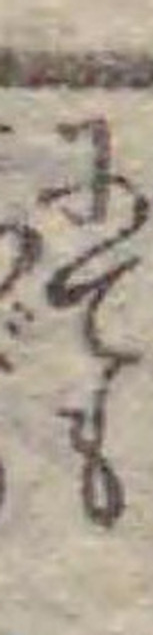にても
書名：四遍搨心学草帋 : 3巻
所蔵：国立国会図書館 National Diet Library, JAPAN
